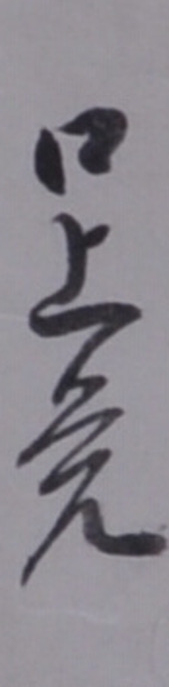口上覚
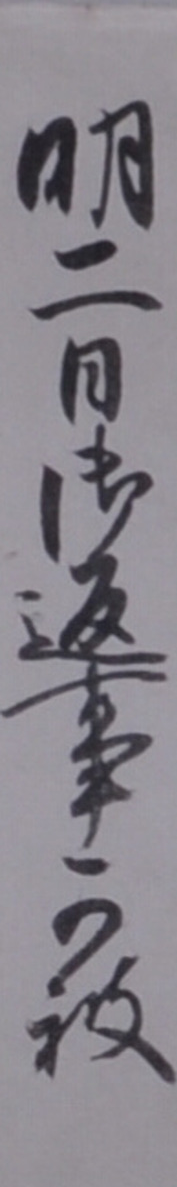明二日御返事可致
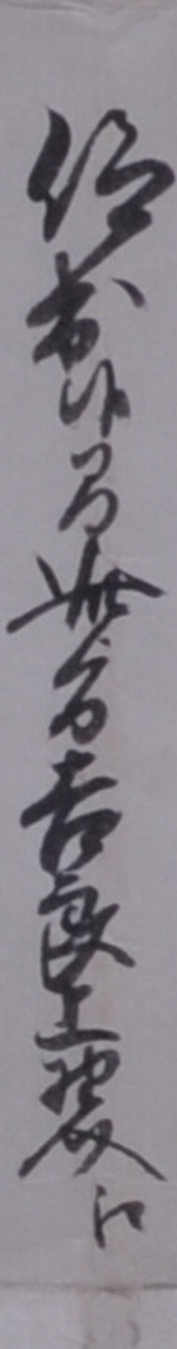仰出候間此間吉良上野介え
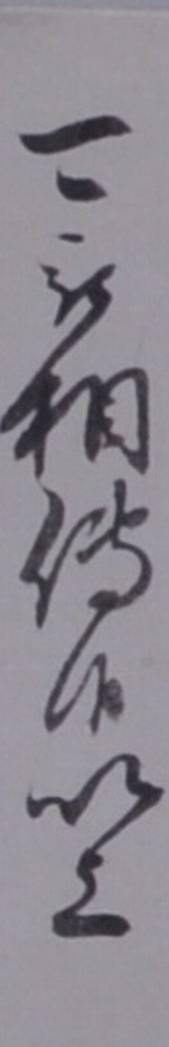可被相伝候以上
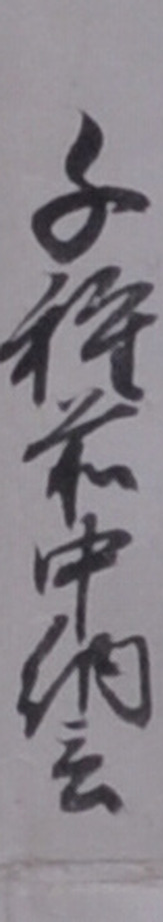千種前中納言
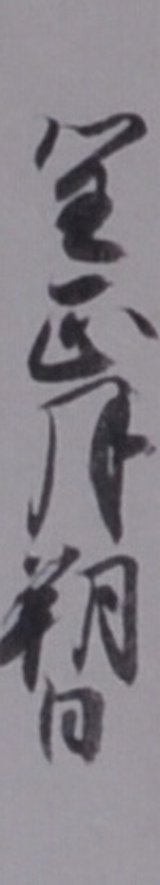閏正月朔日
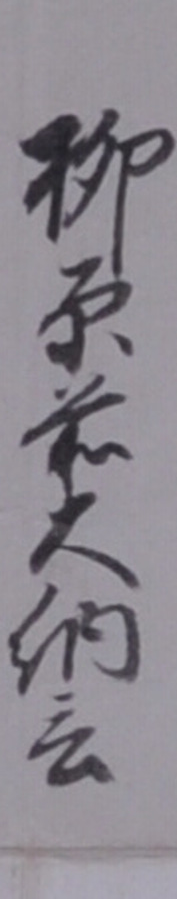柳原前大納言
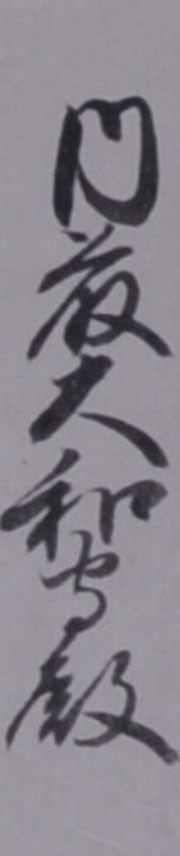内藤大和守殿
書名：口上覚
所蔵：伊那市立高遠町図書館・合同会社AMANE
